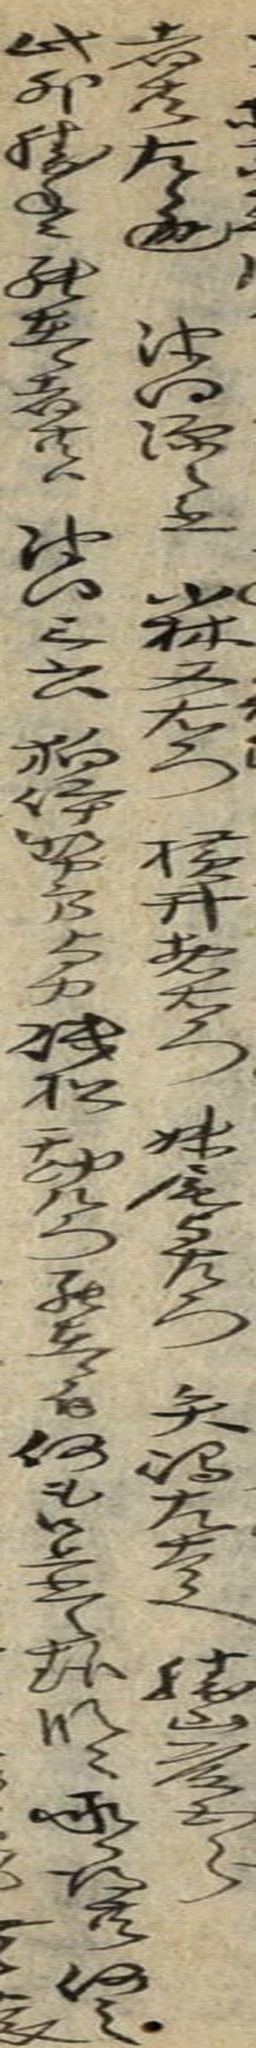此外勝手に罷在候者共は津田三六狛伊勢方与力磯松勘左衛門罷在候に付何も口上書之趣段々承候得共何之
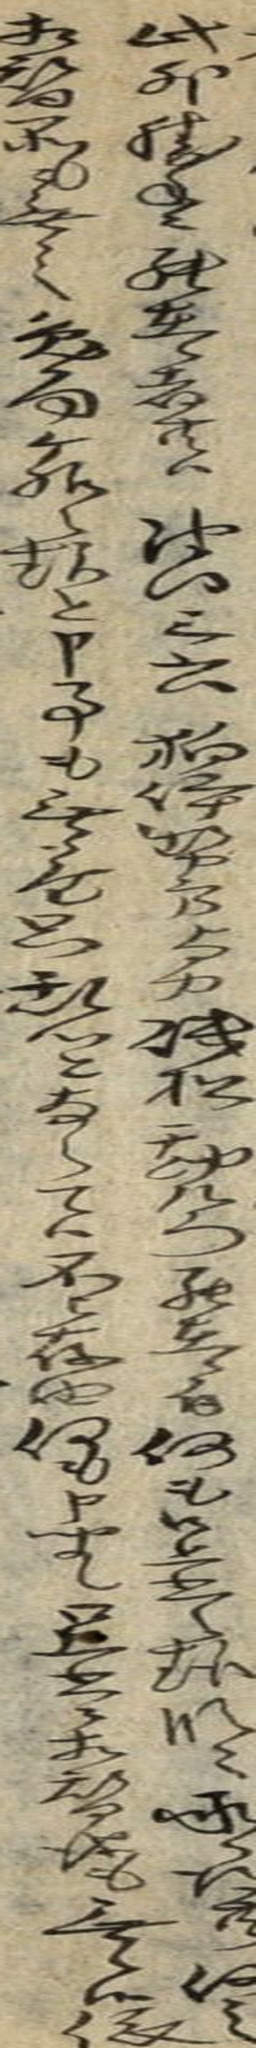相替品も無之兎角ケ様之趣と申事も無御座只乱心とならては不被存由何も申聞候口上書に相替儀も無之候依
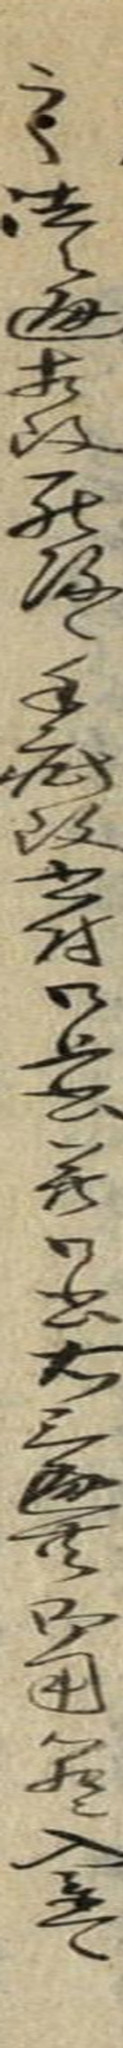之法之通相改罷帰候手疵改書付口上書并口書右三通共御用箱へ入置候
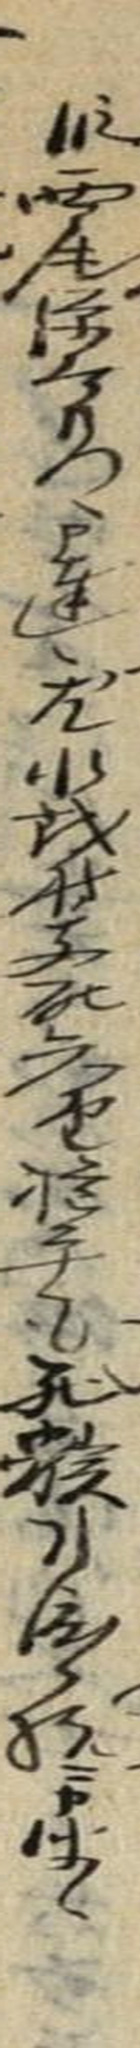段西尾源太左衛門へ申達候尤水越村支配矢野権平へも死骸引渡候様に申聞候
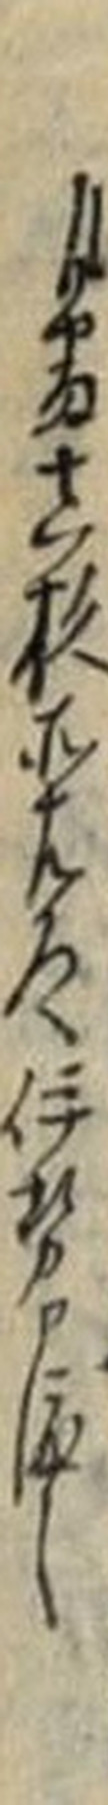月番真杉所左衛門へ伊勢申渡之
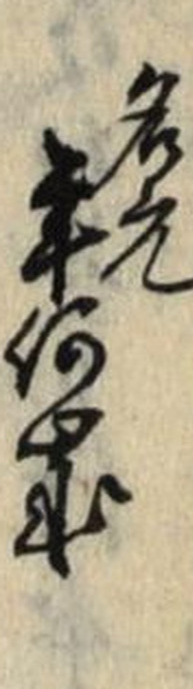年何歳
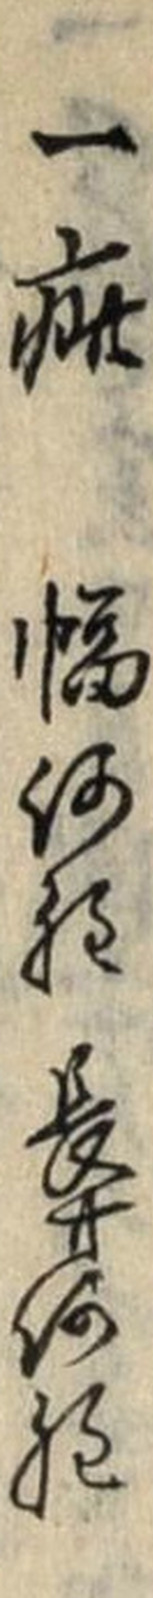一疵幅何程長サ何程
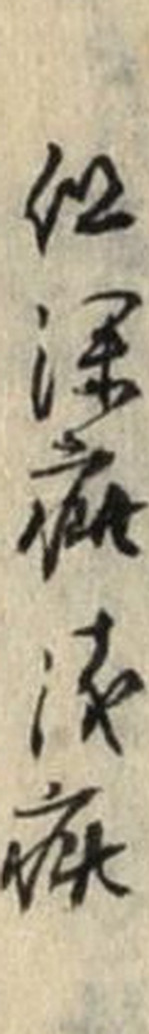但深傷浅疵
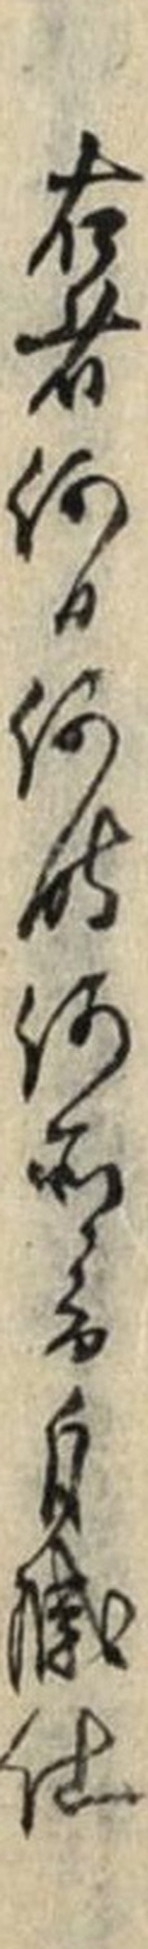右者何日何時何所にて自滅仕
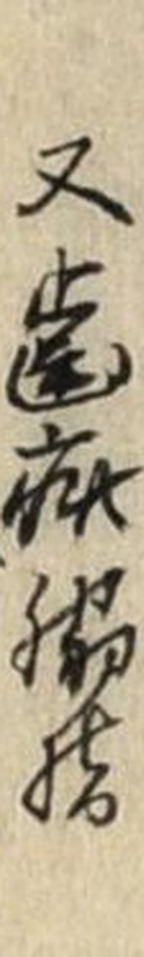又歯疵脇指
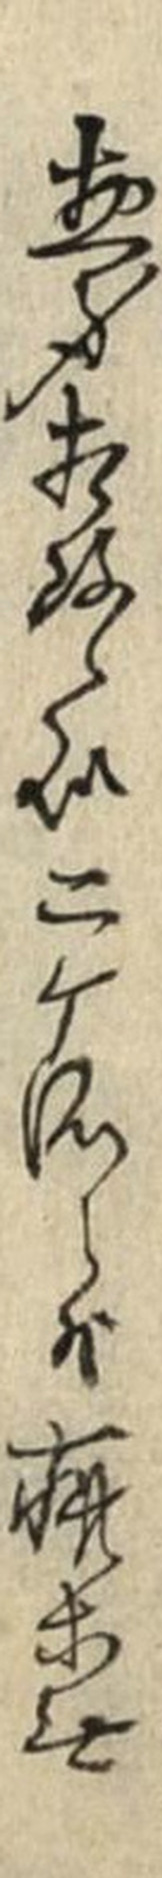惣身相改候処二ケ所之外疵等無
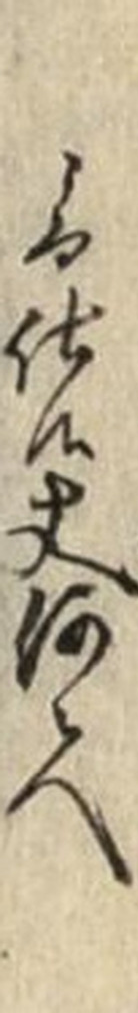にて仕候丈何尺
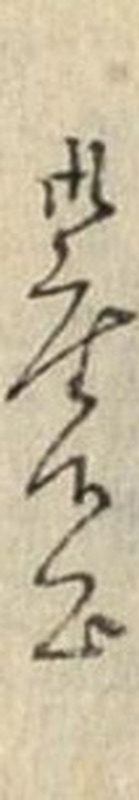御座候以上
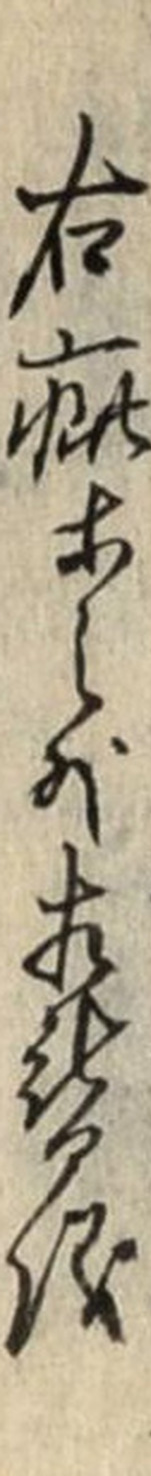右疵等之外相替儀
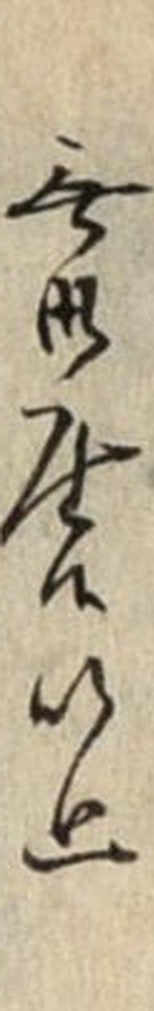無御座候以上
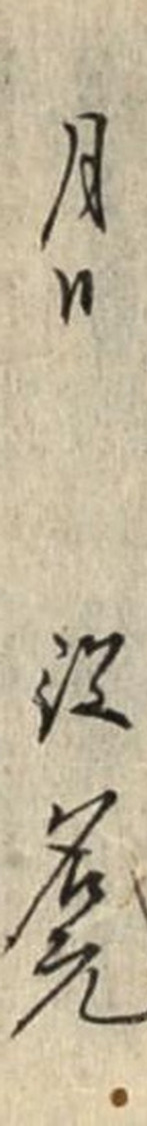月日役名元
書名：御停止異変死失
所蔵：福井県文書館 Fukui Prefectural Archives
